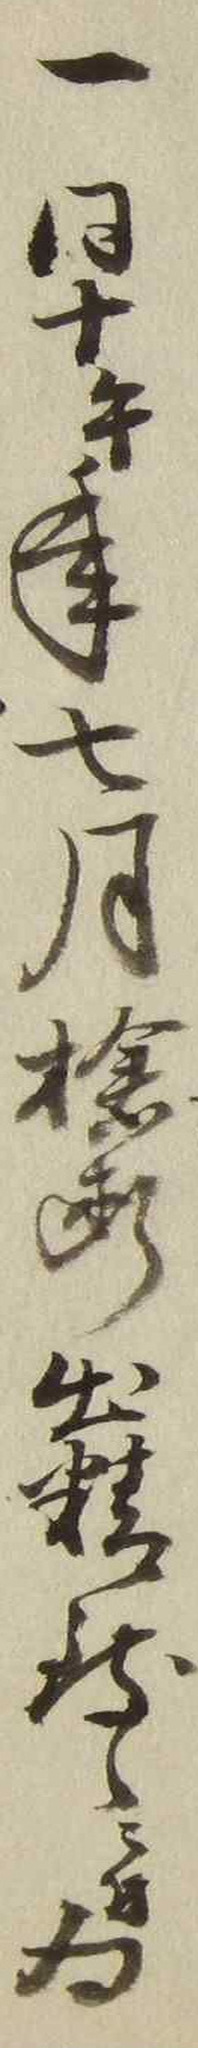一同十午年七月槍術出精致候ニ付為
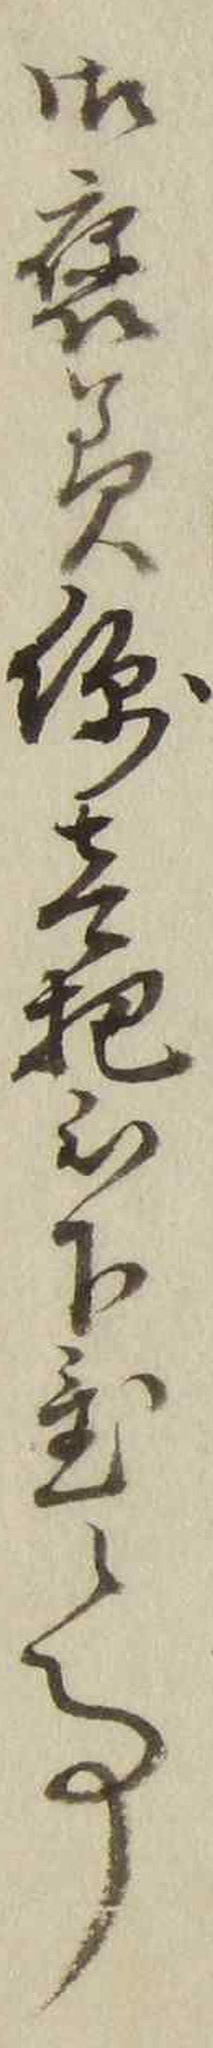御褒美綿壱把被下置候事

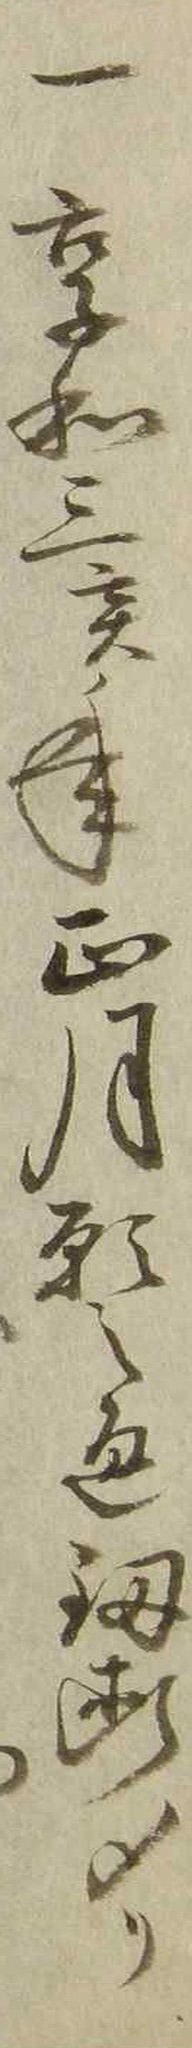一享和三亥年正月願之通剣術〆り
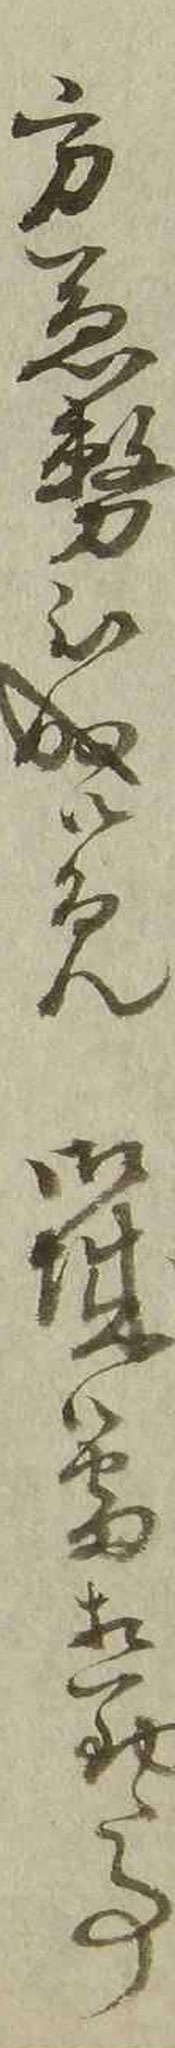方着務被成御免御城御番相勤候事
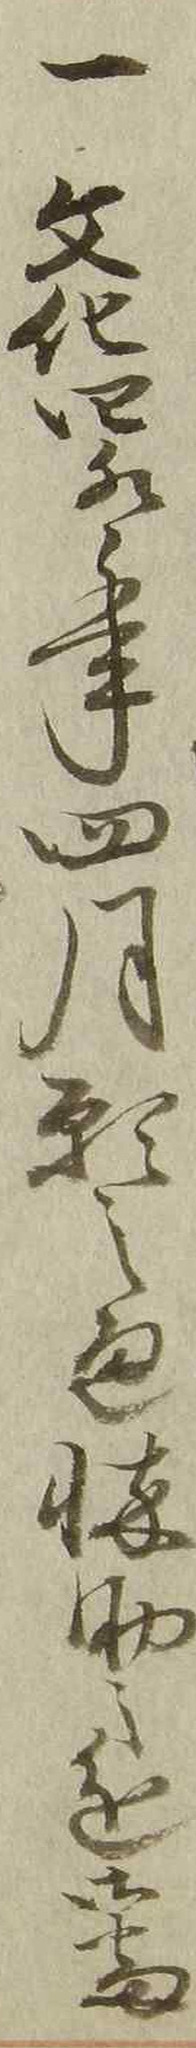一文化四卯年四月願之通忰助之進御番
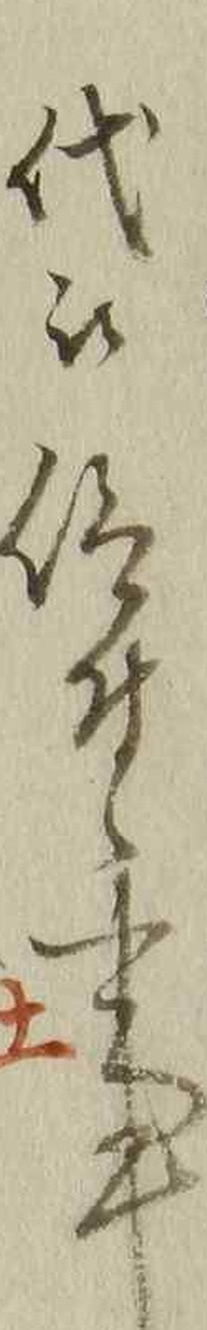代被仰付候事
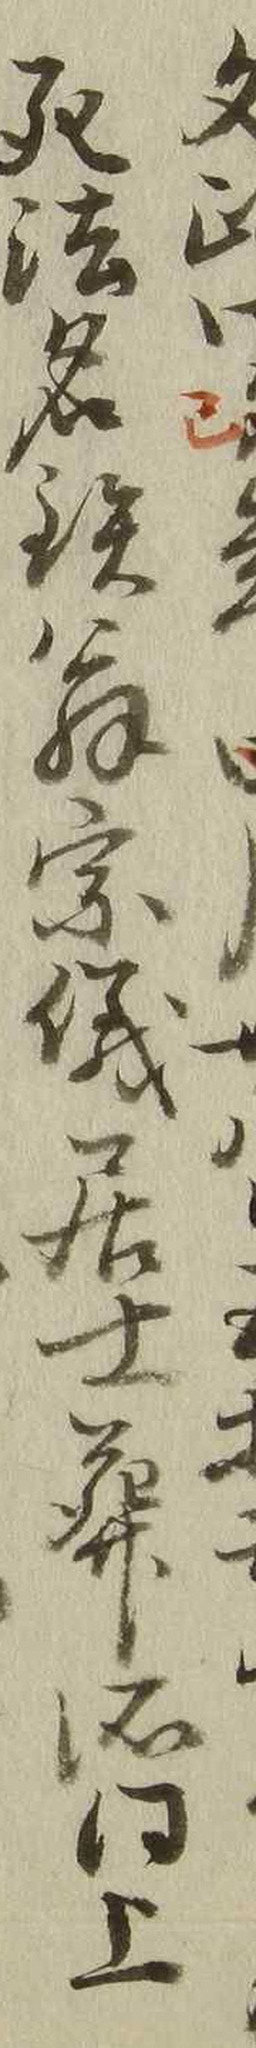死法名鉄翁宗儀居士葬所同上
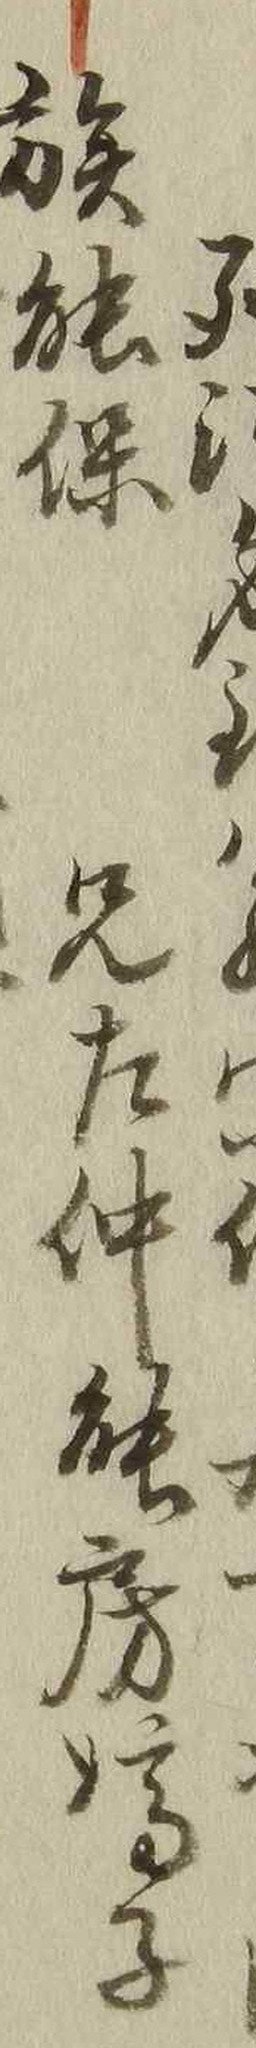族能保兄左仲能房嫡子
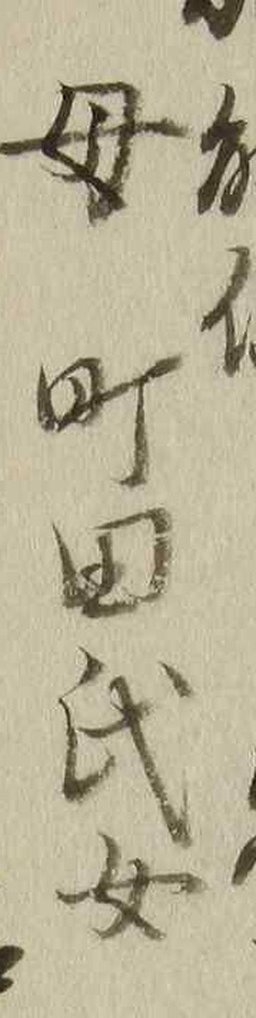母町田氏女
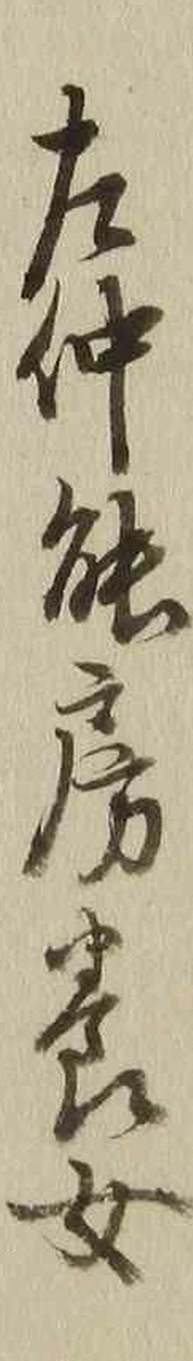女左仲能房養女
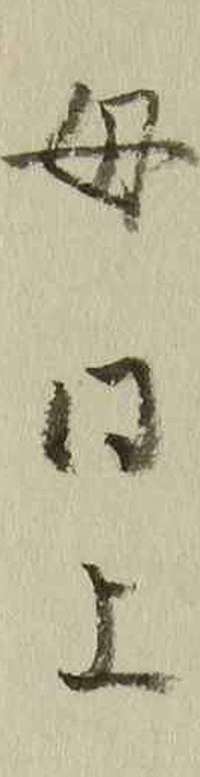母同上
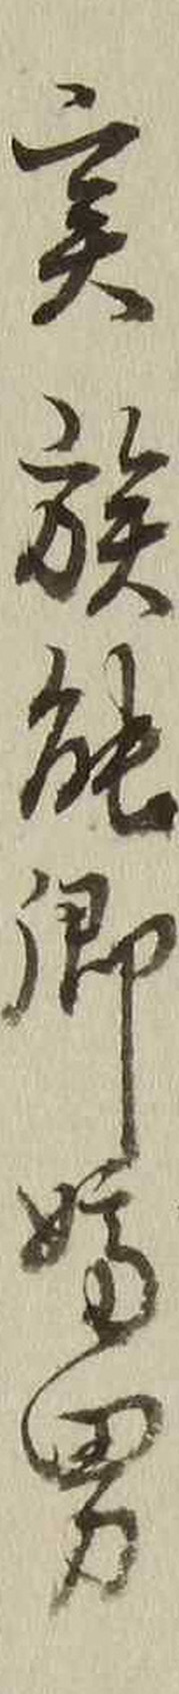実族能郷嫡男
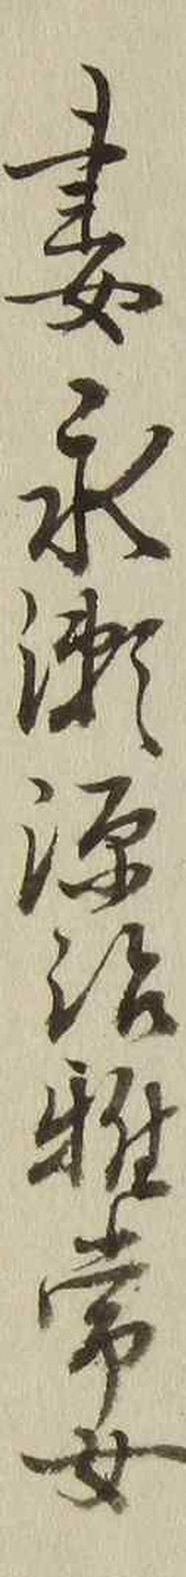妻永瀬源治雅常女
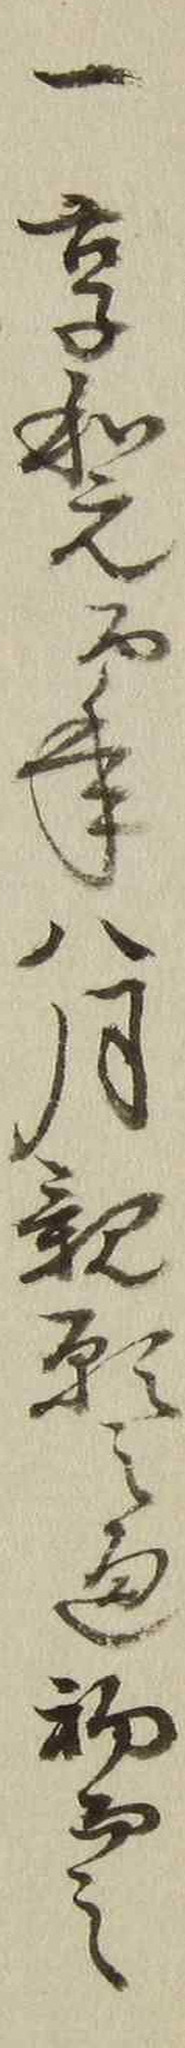一享和元酉年八月親願之通初而之
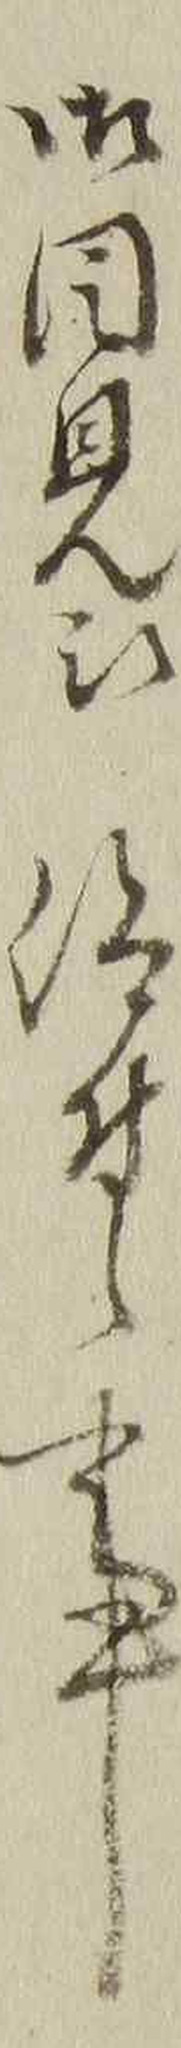御目見被仰付候事
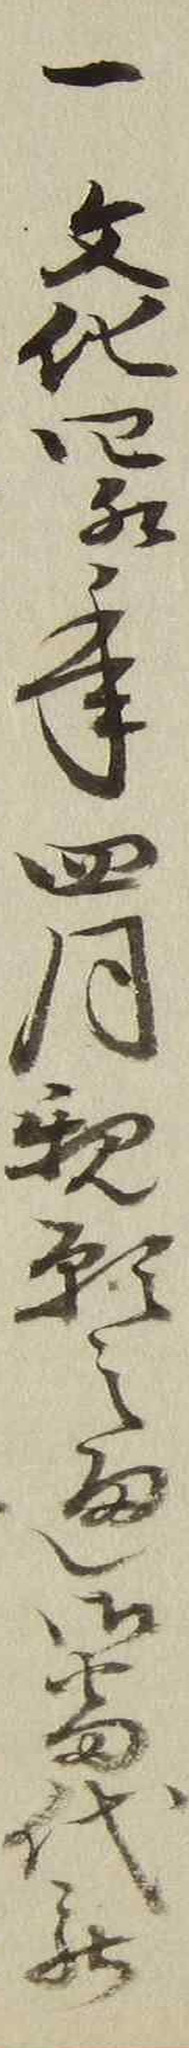一文化四卯年四月親願之通御番代被
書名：諸士系譜　巻之53　に之部4
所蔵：会津若松市立会津図書館
